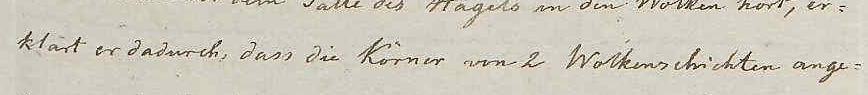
klärt er dadurch, dass die Körner von 2 Wolkenschichten ange-
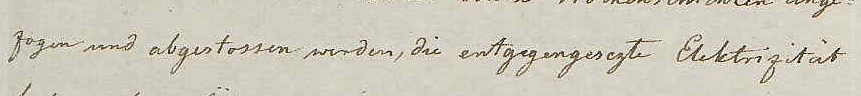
zogen und abgestossen werden, die entgegengesezte Elektrizität
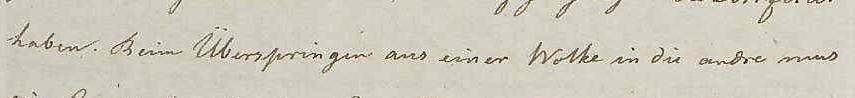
haben. Beim Überspringen aus einer Wolke in die andre mus
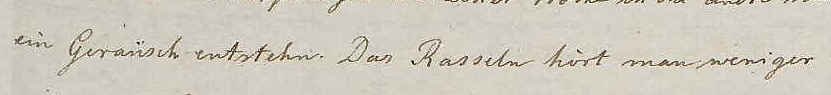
ein Geräusch entstehn. Das Rasseln hört man weniger
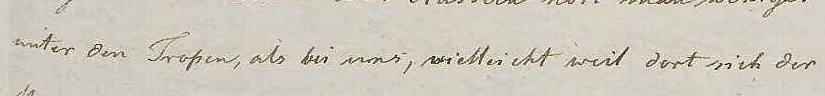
unter den Tropen, als bei uns, vielleicht weil dort sich der
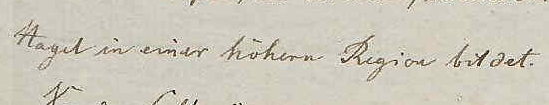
Hagel in einer höhern Region bildet.
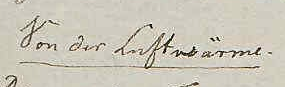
Von der Luftwärme.
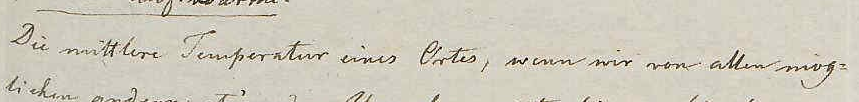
Die mittlere Temperatur eines Ortes, wenn wir von allen mög-
